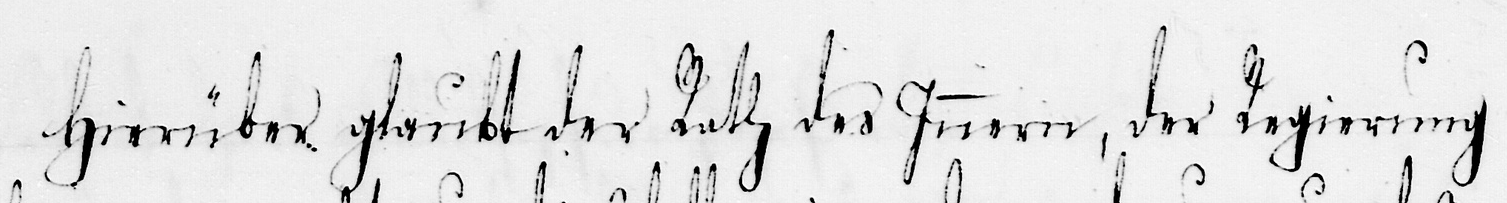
Hierüber glaubt der Rath des Innern, der Regierung
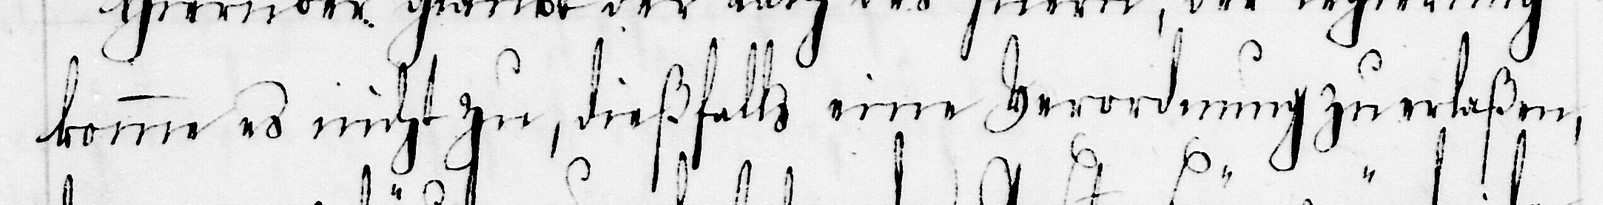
komme es nicht zu, dießfalls eine Verordnung zu erlaßen,
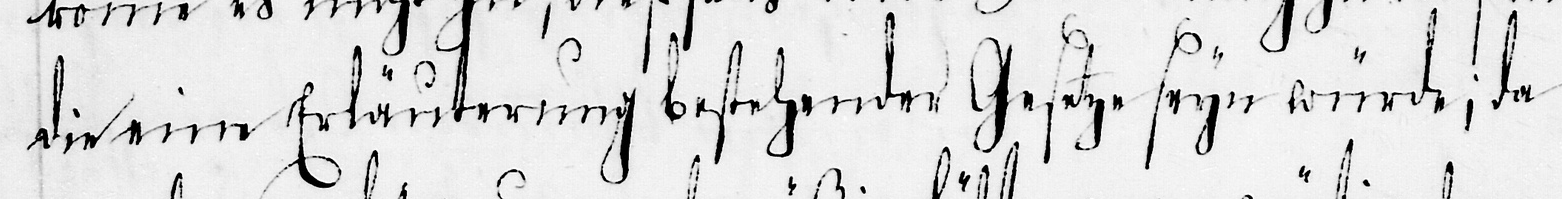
die eine Erläuterung bestehender Gesetze seyn würde; da
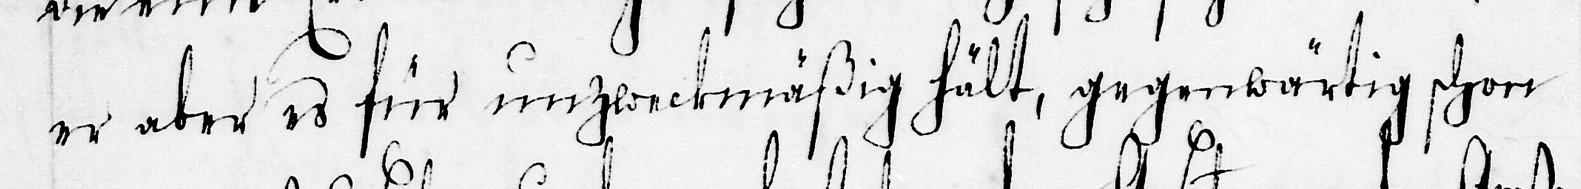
er aber es für unzweckmäßig hält, gegenwärtig schon
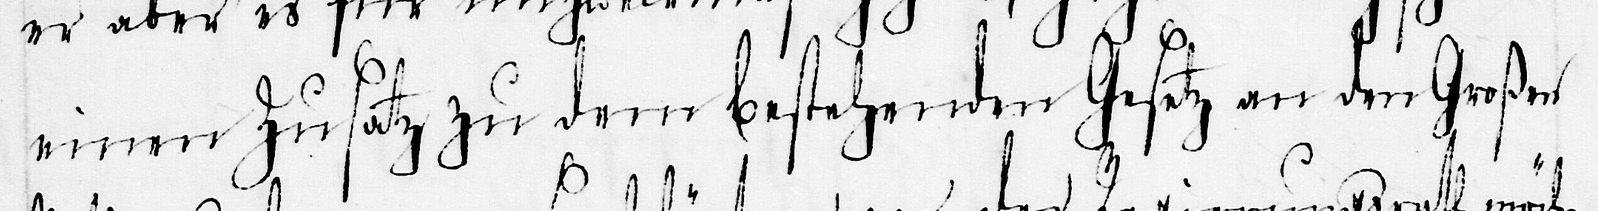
einen Zusatz zu dem bestehenden Gesetz an den Großen
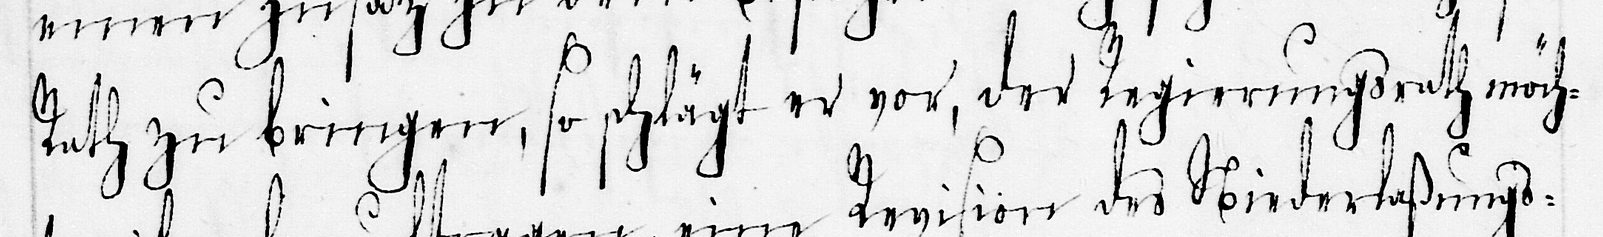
Rath zu bringen, so schlägt er vor, der Regierungsrath möch¬
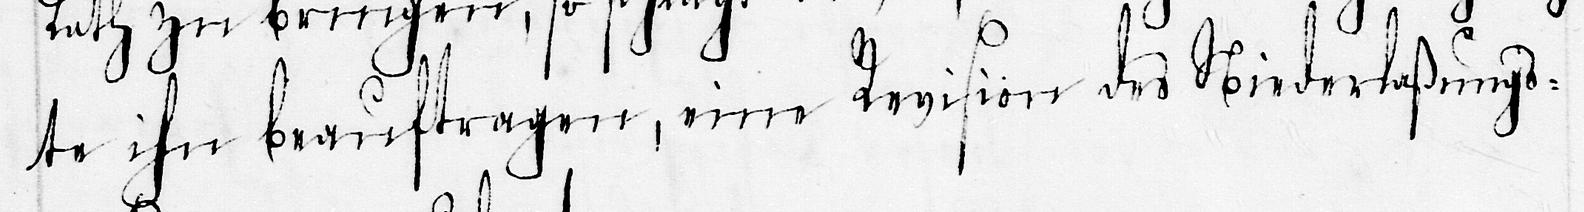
te ihn beauftragen, eine Revision des Niederlaßungs¬
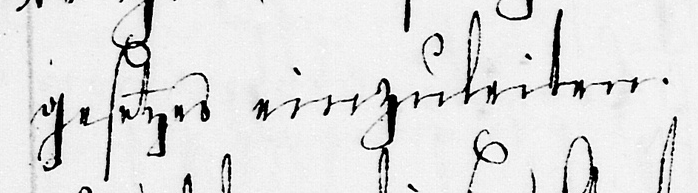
gesetzes einzuleiten.
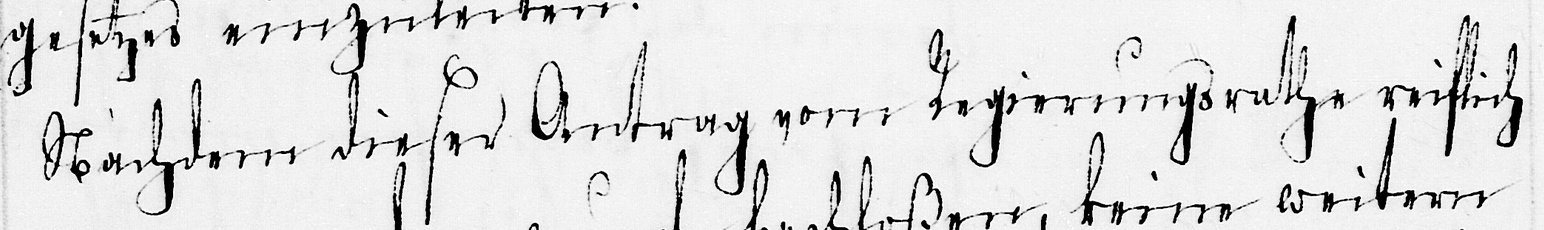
Nachdem dieser Antrag vom Regierungsrathe reiflich
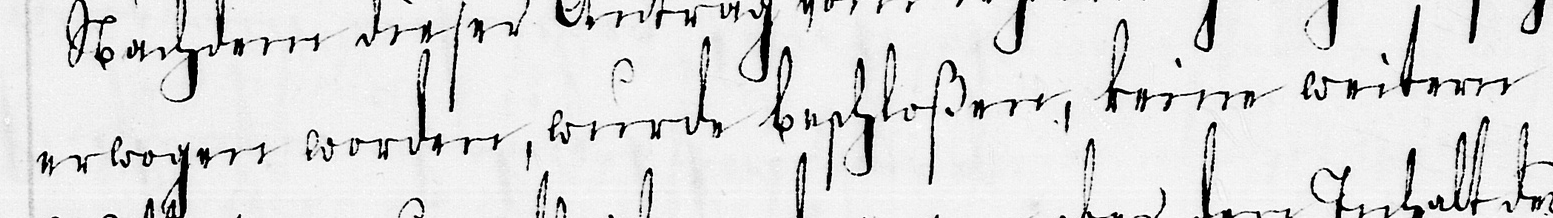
erwogen worden, wurde beschloßen, keine weitern
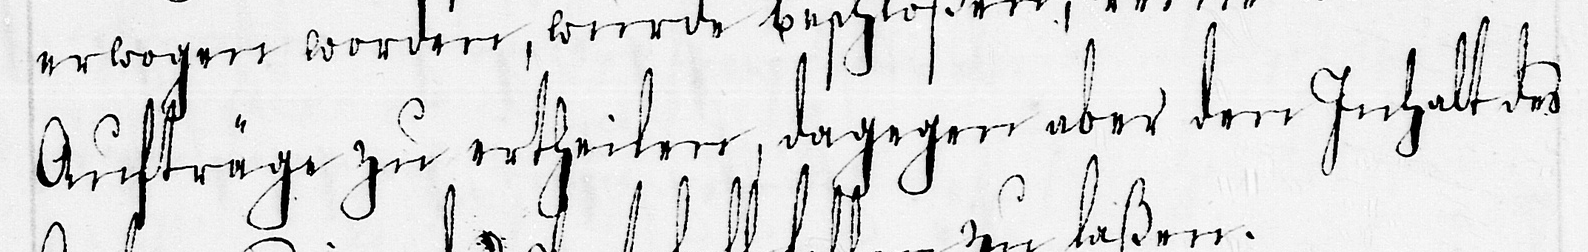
Aufträge zu ertheilen, dagegen aber den Inhalt des
